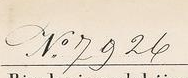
No 7926
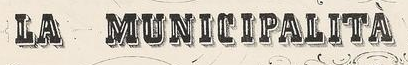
Confederazione Svizzera – Cantone Ticino
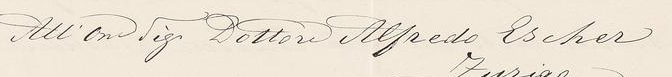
All' Onorevole Signor Dottore Alfredo Escher
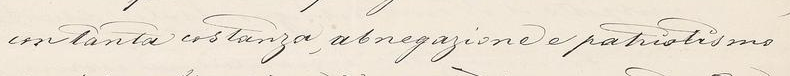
con tanta costanza, abnegazione, e patriotismo
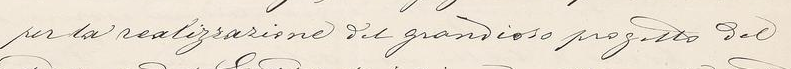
per la realizzazione del grandioso progetto del
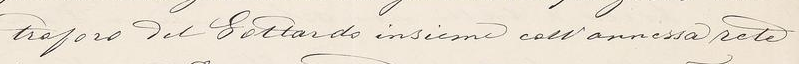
traforo del Gottardo insieme coll'annessa rete
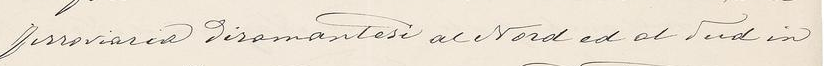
ferroviaria diramantesi al Nord ed al Sud in
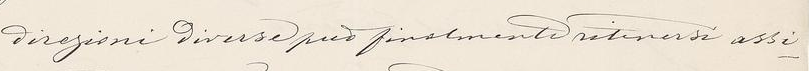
direzioni diverse può finalmente ritenersi assi-
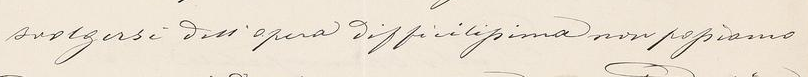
svolgersi dell'opera dificilissima non possiamo
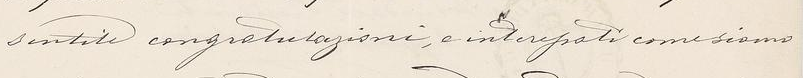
sentite congratulazioni, e interessati come siamo
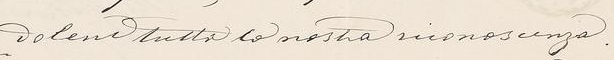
dolene tutta la nostra riconoscenza.
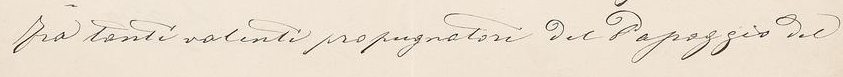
Tra tanti valenti propugnatori dell'appoggio del
